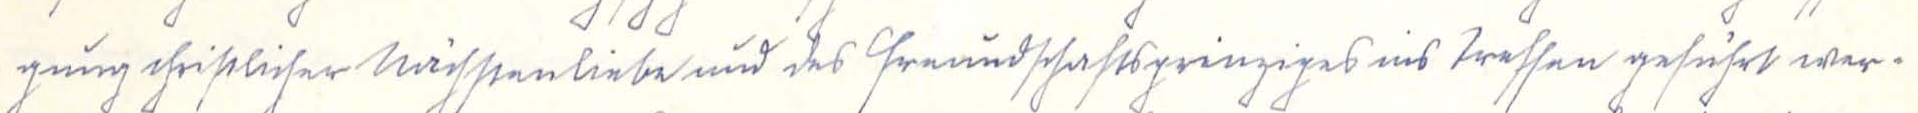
gung christlicher Nächstenliebe und des Freundschaftsprinzipes ins Treffen geführt wer-
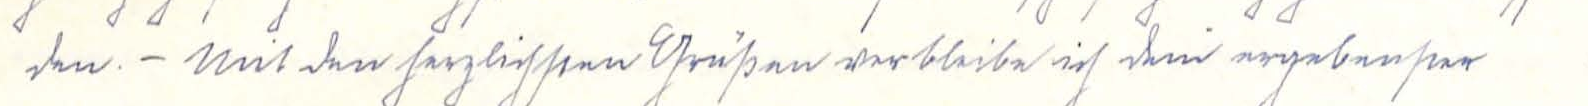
den.- Mit den herzlichsten Grüßen verbleibe ich dein ergebenster
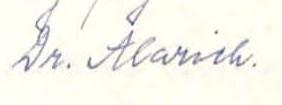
Dr. Alarich
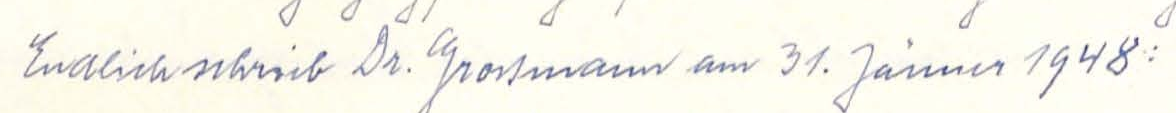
Endlich schrieb Dr. Grossmann am 31. Jänner 1948
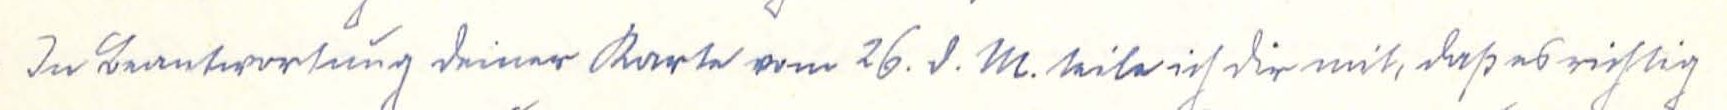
In Beantwortung deiner Karte am 26. d. M. teile ich dir mit, daß es wichtig
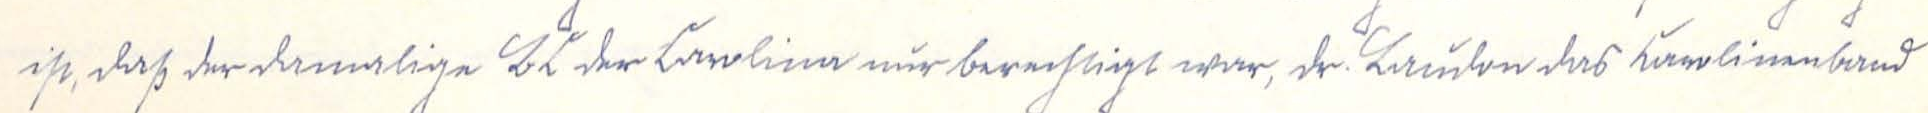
ist, daß der damalige BC der Carolina nur berechtigt war, Dr. Laudon das Carolinenband
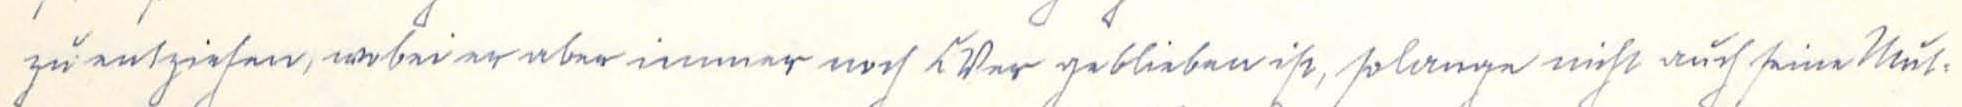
zu entziehen, wobei er aber immer noch CVer geblieben ist, solange nicht auch seine Mut-
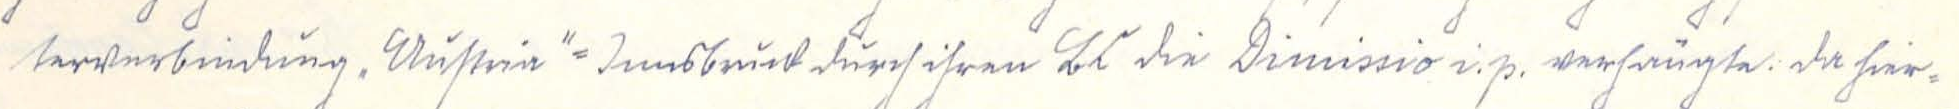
terverbindung "Austria"-Innsbruck durch ihren BC die Dimissio i. p. verhängte. Da hier-
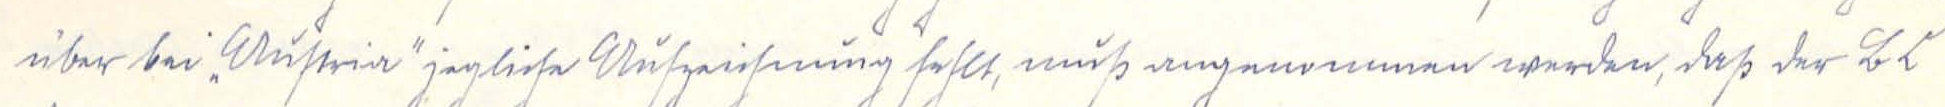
über bei "Austria" jegliche Aufzeichnung fehlt, muß angenommen werden, daß der BC
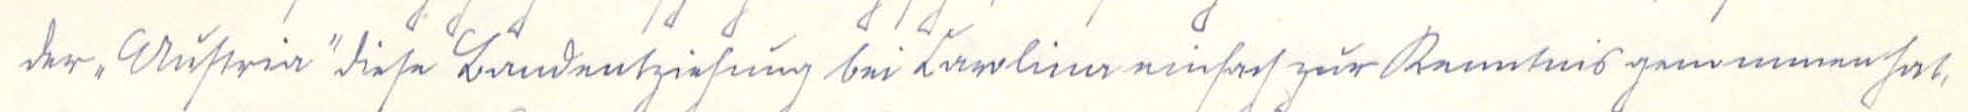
der "Austria" diese Bandentziehung bei Carolina einfach zur Kenntnis genommen hat,
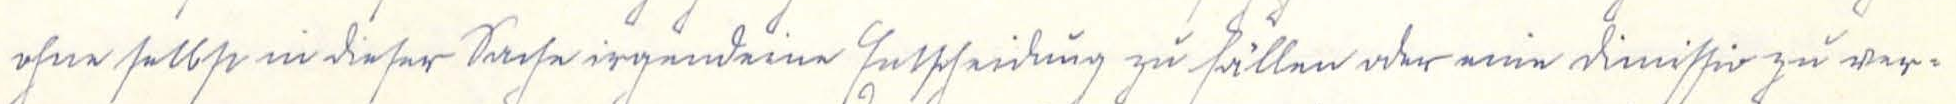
ohne selbst in dieser Sache irgendeine Entscheidung zu fällen oder eine Dimission zu ver-
